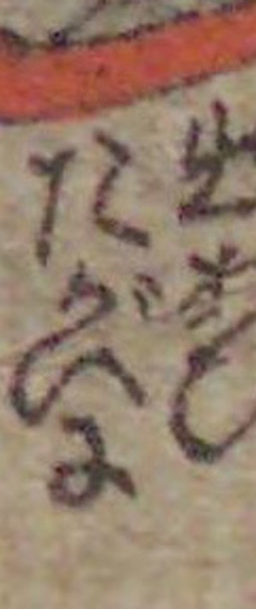たがいに
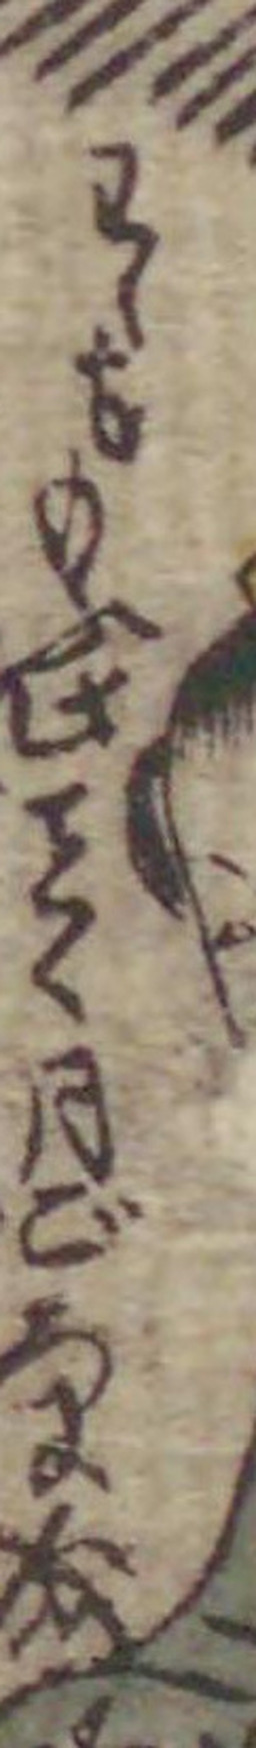わしももふ此ことく月ごろに
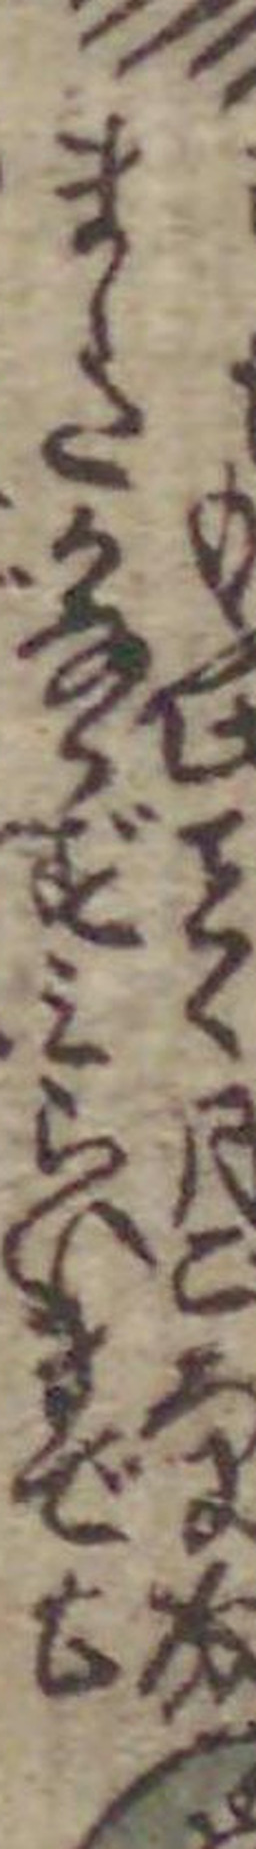ましたかならずみらいまでも
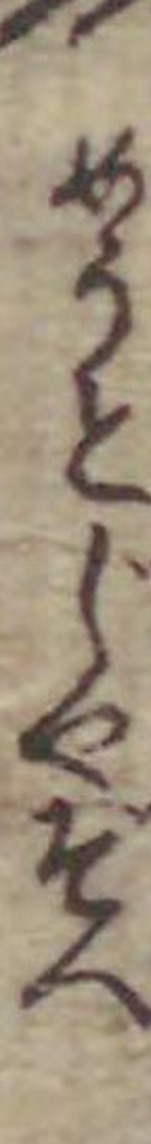めうとじやぞへ
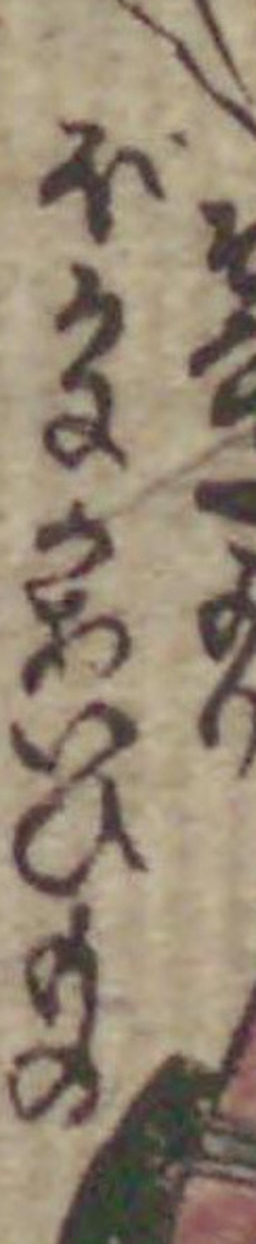ほかにかあいひもの
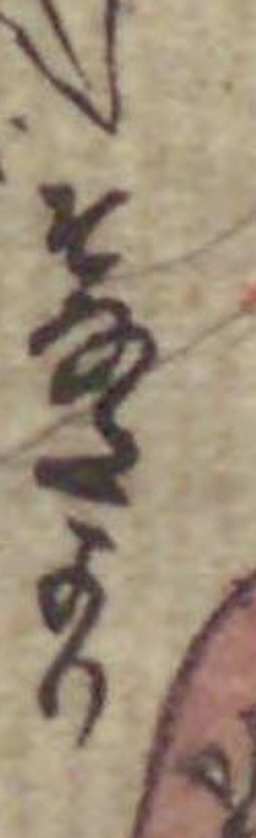そなたより
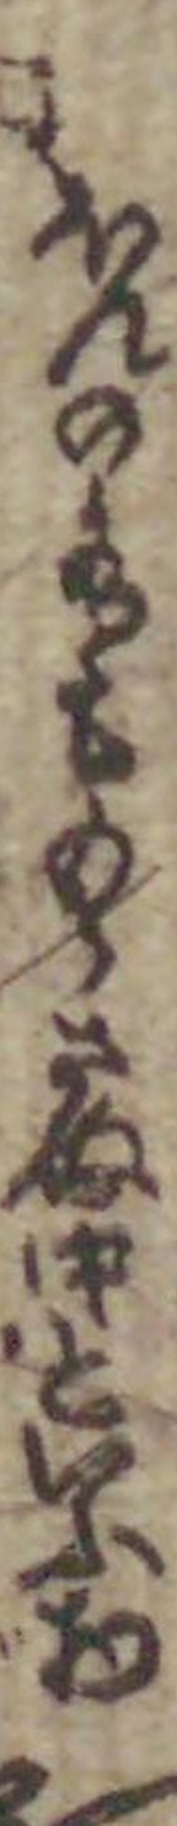ほんの水ももらさぬ中といふ物
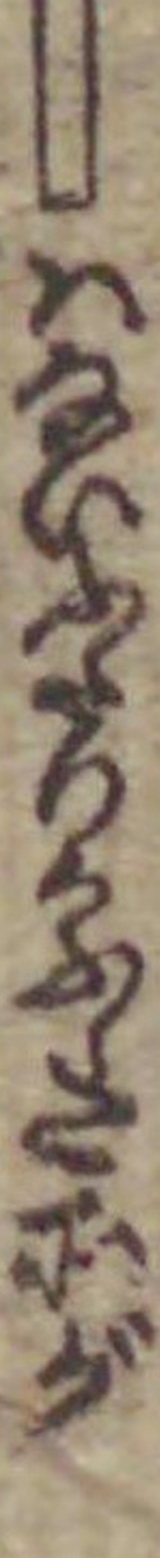はないふたりかふした所が

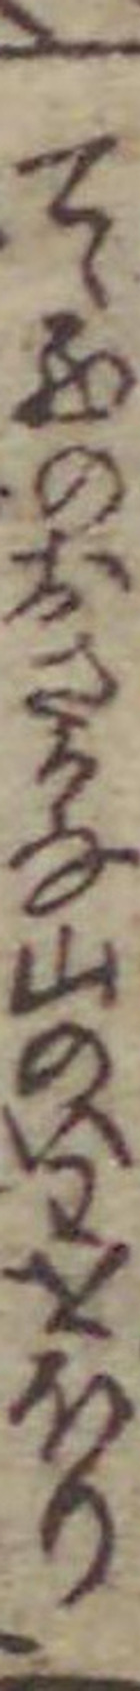てし舟のおさかな山のいわをほり
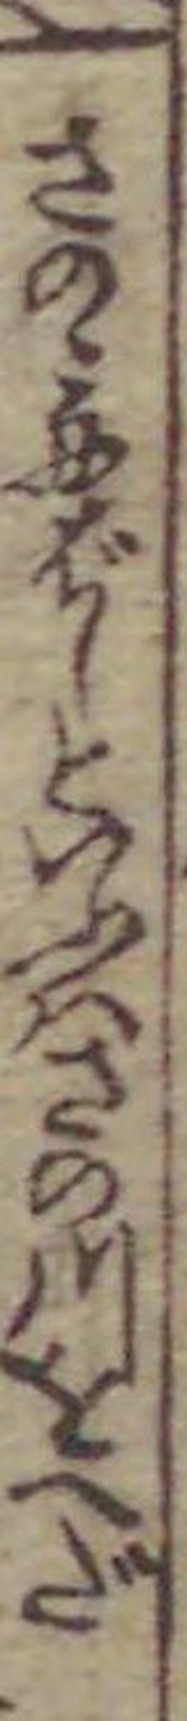さのゝ舟ばしといふはさの川をへだ
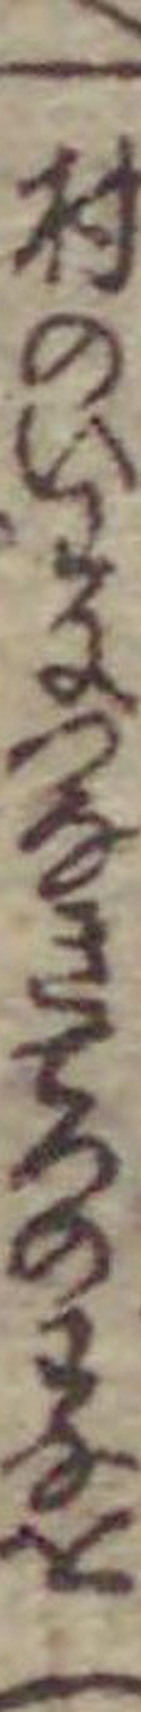村のいわにつなきてつのわなを
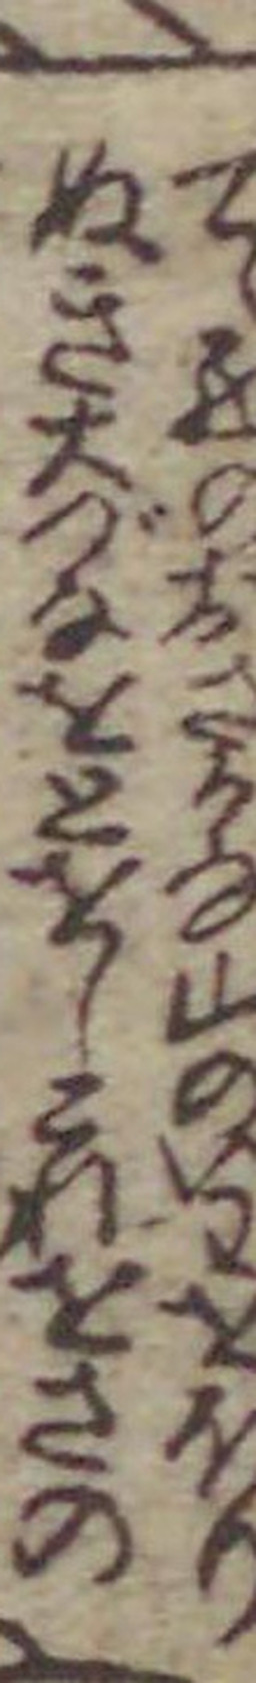ぬき大づなをとをしこれをさの
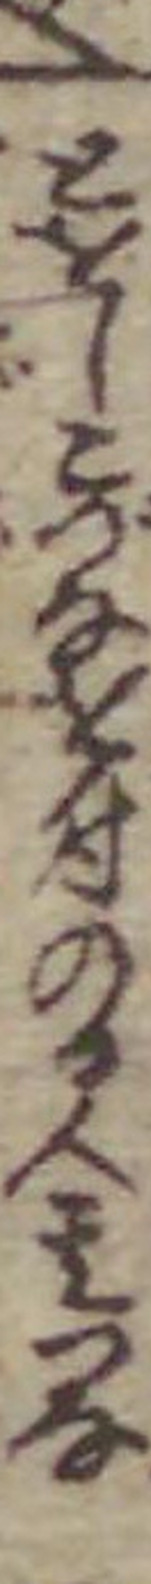とをしこづなを舟のる人其つな
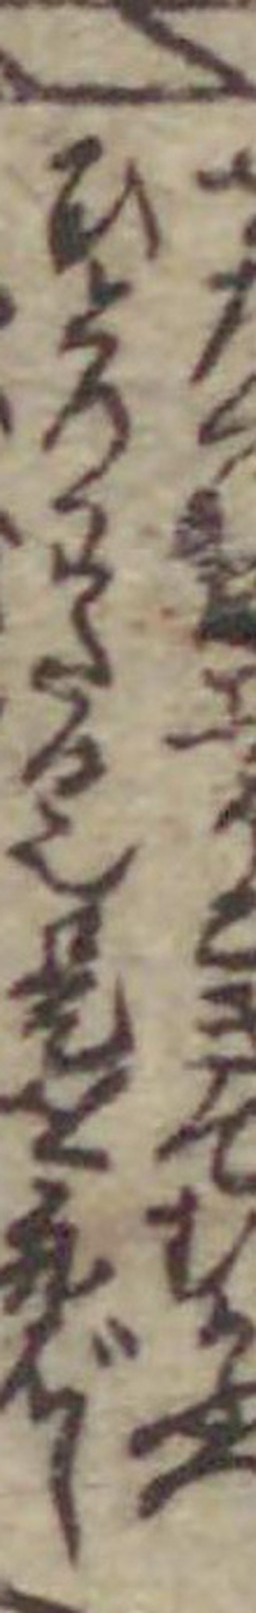ひとりわたる也是を舟ばし
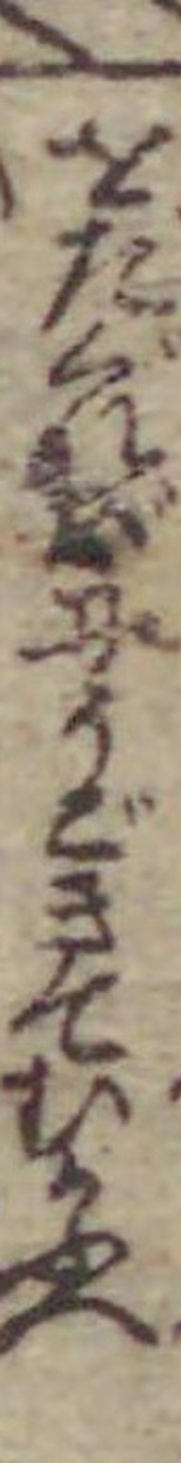をたぐれば舟うごきてむかふへ
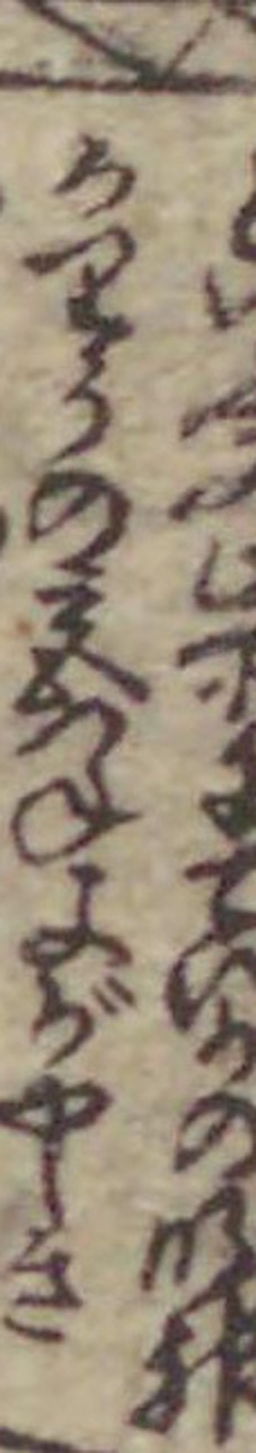かりうのつねよがやしき
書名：娜二代鉢木 5巻
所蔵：国立国会図書館 National Diet Library, JAPAN
